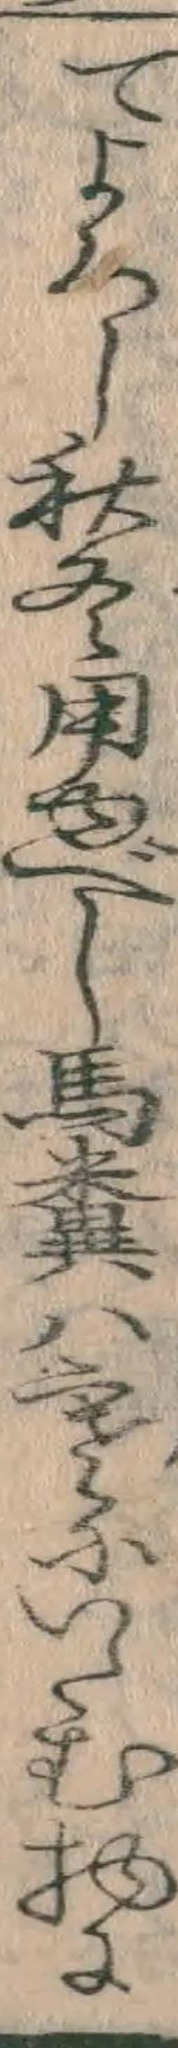てよろし秋冬用ゆべし馬糞は寒にいたむ物に
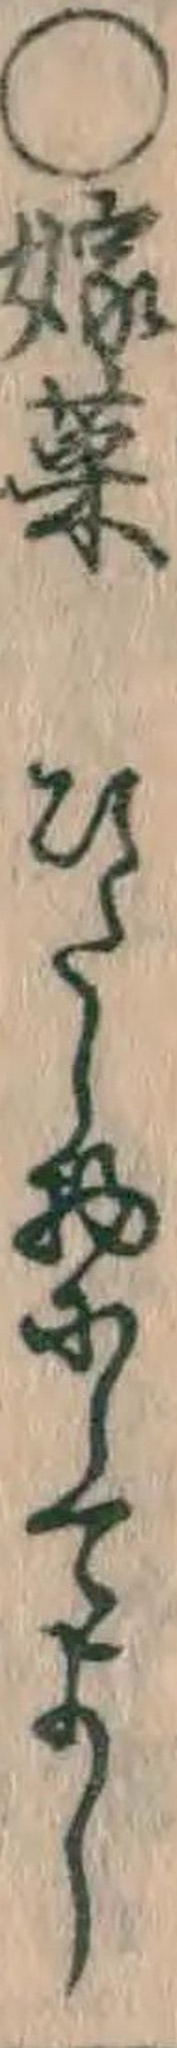○嫁菜ひたし物にしてよし
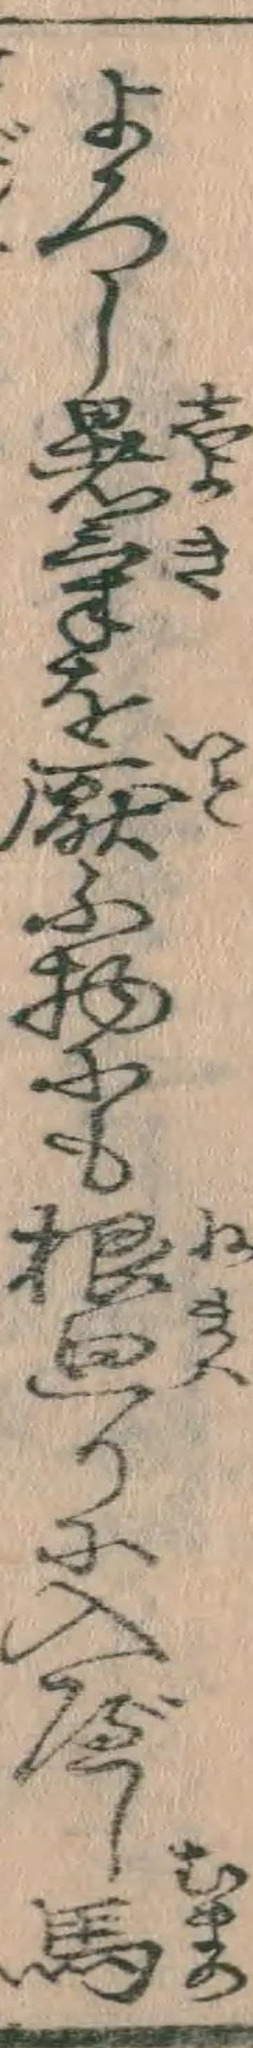よろし暑気を厭ふ物にも根廻りに入べし馬
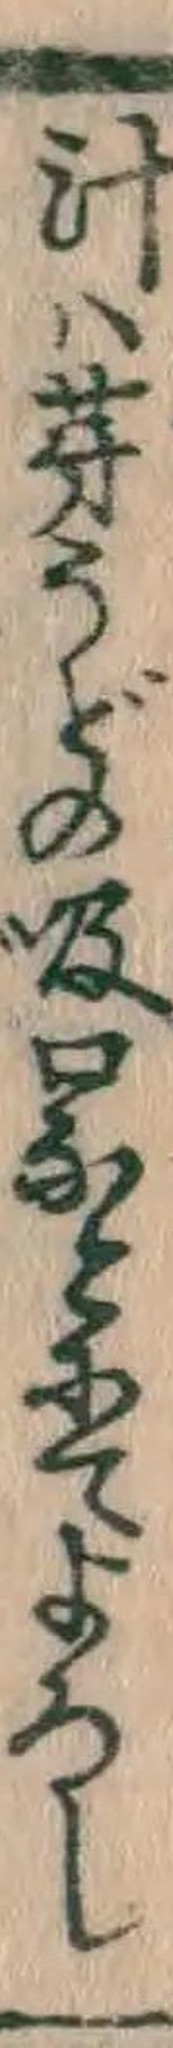汁は芽うどの吸口なとにてよろし
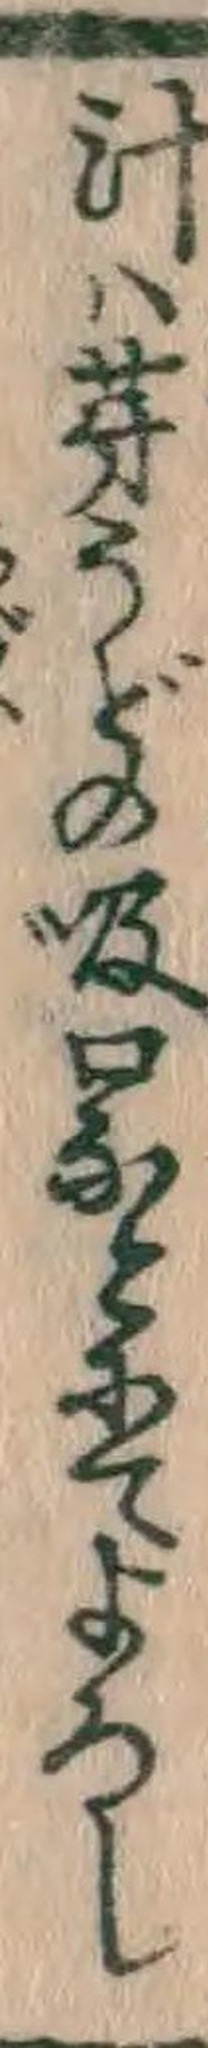汁は芽うどの吸口なとにてよろし
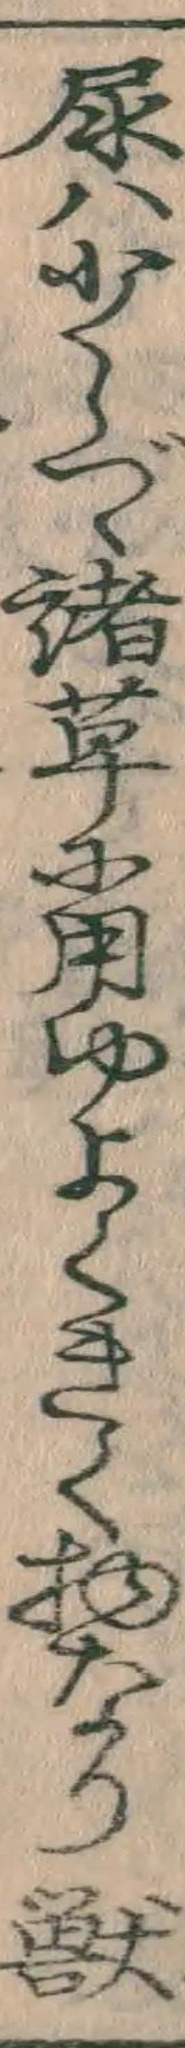尿は少しづゝ諸草に用ゆよくきく物なり獣
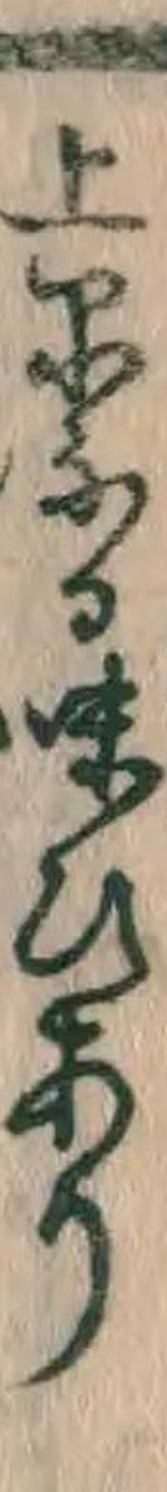上品なる味ひあり
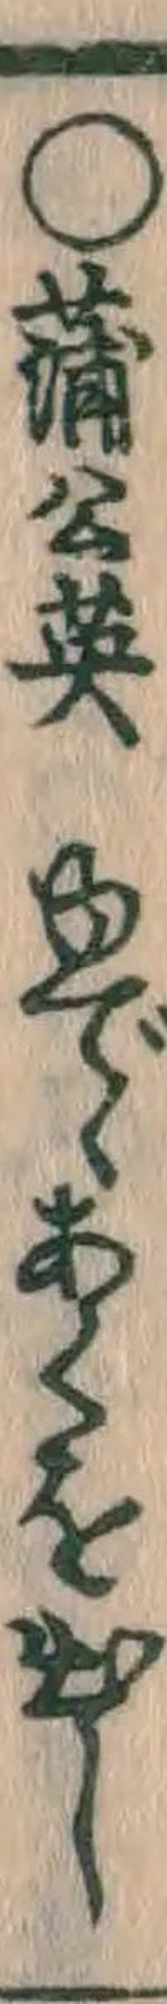○蒲公英ゆでゝあくを出し
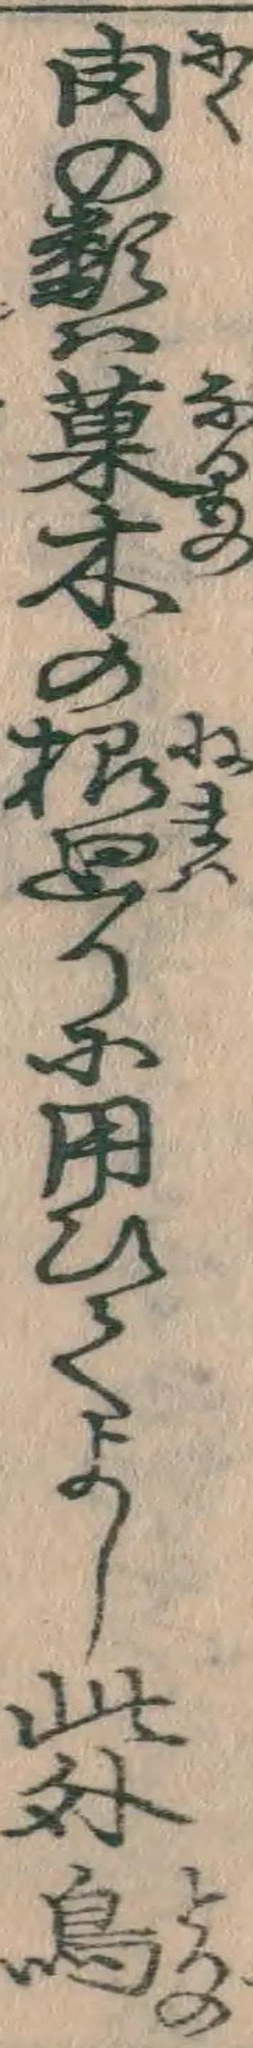肉の類は菓物の根廻りに用ひてよし此外鳥
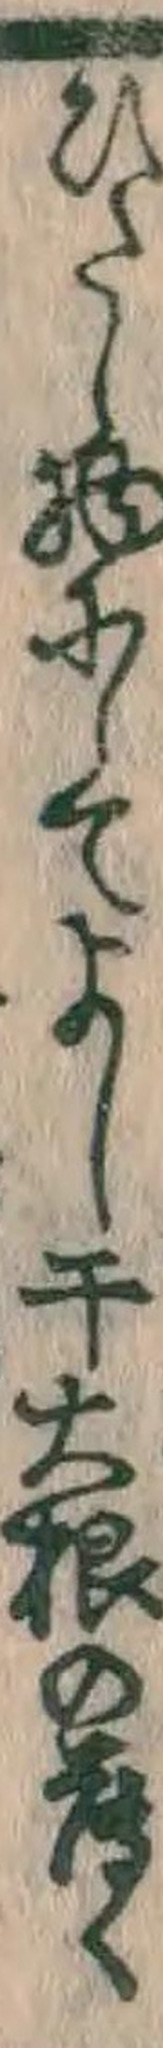ひたし物にしてよし干大根の薄く
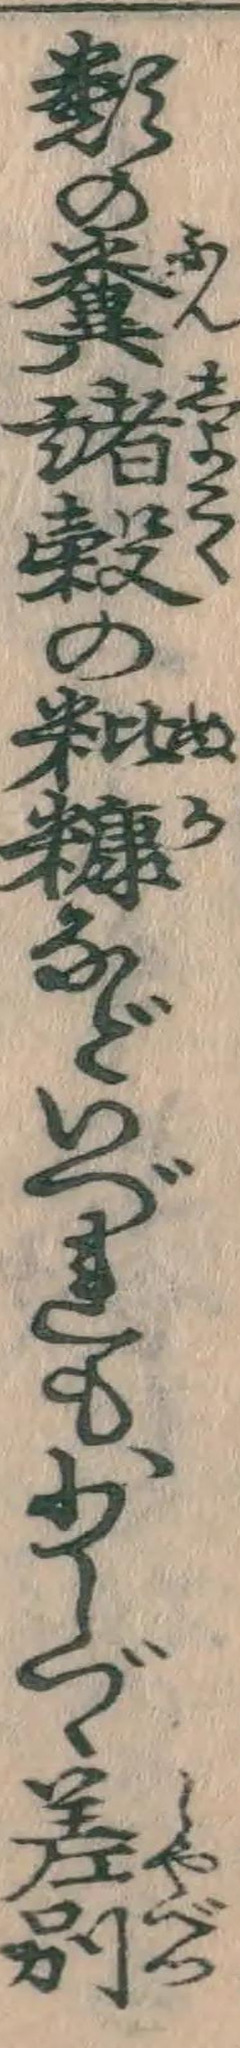類の糞諸穀の粃糠などいづれも少しづゝ差別
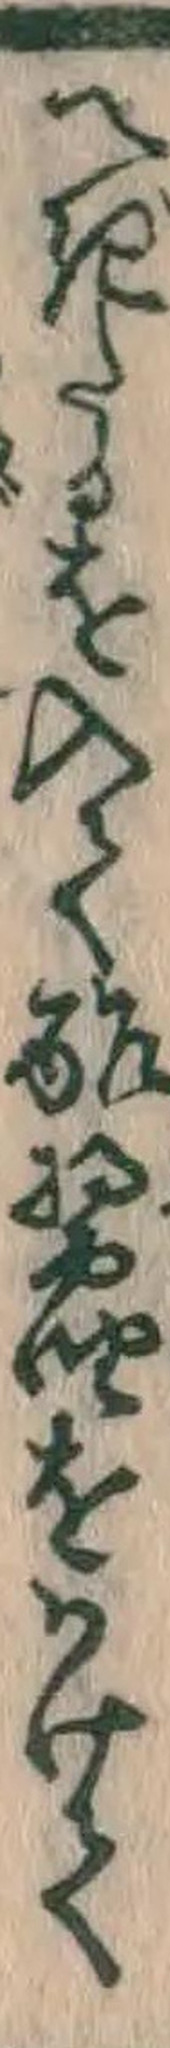へぎたるを入て酢醬油をかけて
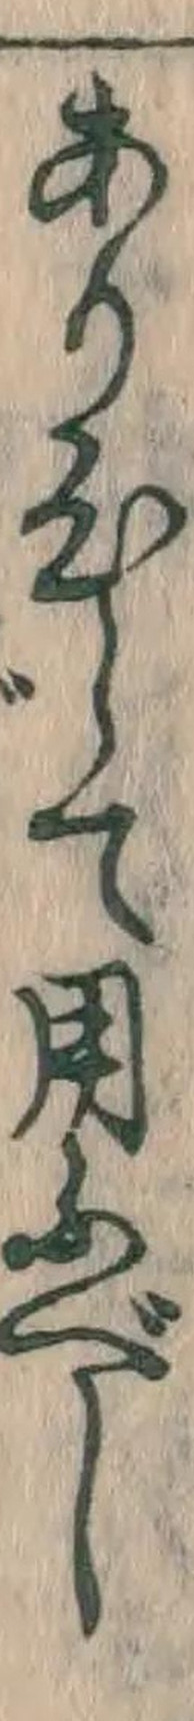あり心して用ふべし
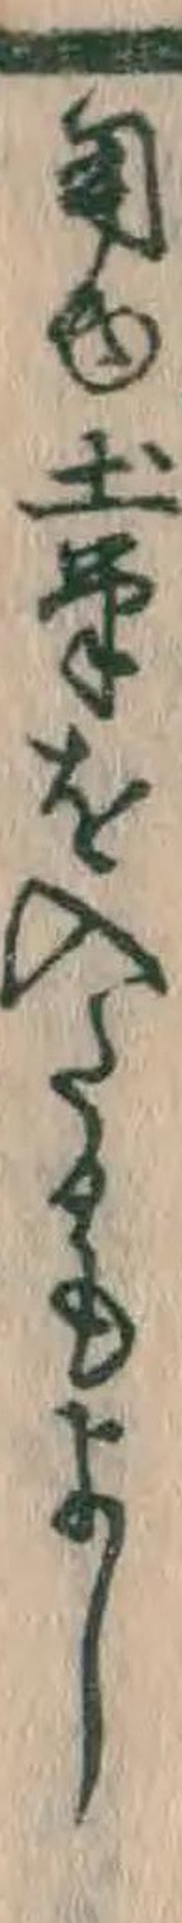用ゆ土筆を入たるもよし
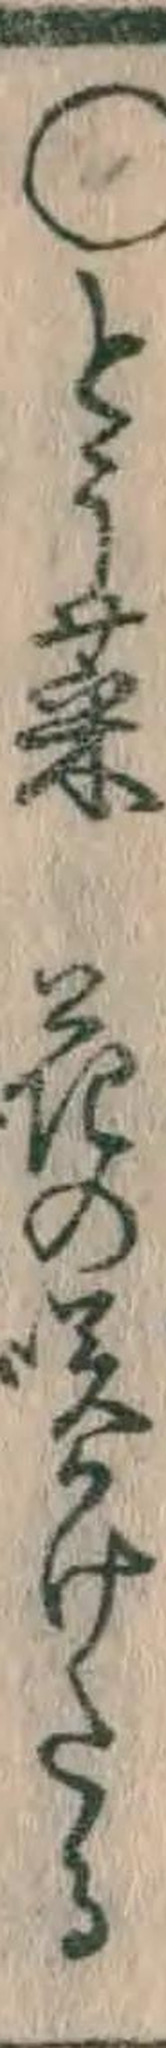○とう菜花の咲かけたる
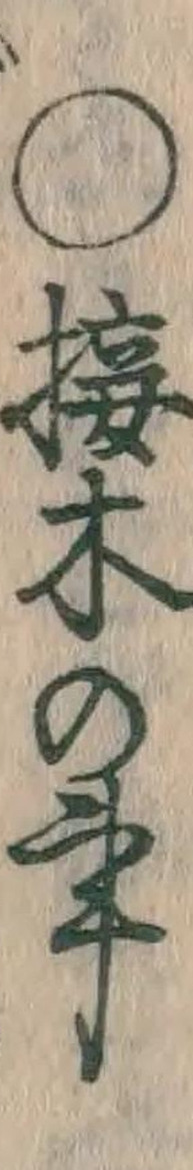○接木の事
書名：広益秘事大全 3巻. [5]
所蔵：国立国会図書館 National Diet Library, JAPAN
